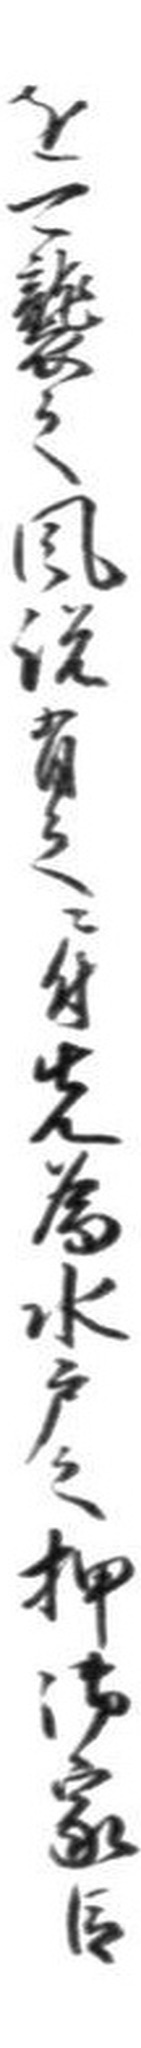を可襲之風説有之ニ付先為水戸之押御家臣
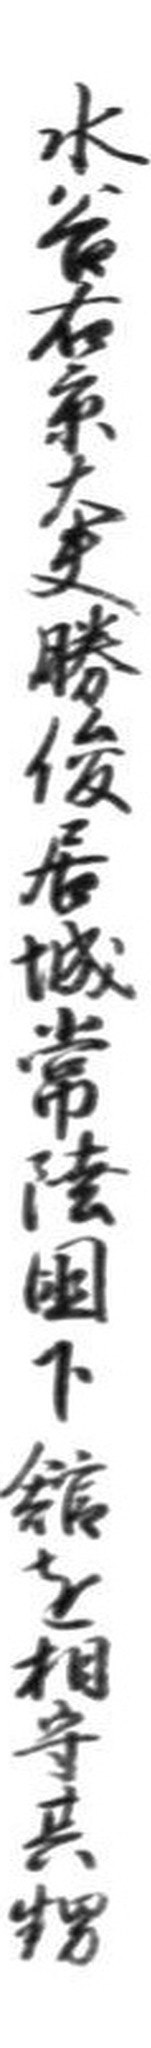水谷右京大夫勝俊居城常陸国下館を相守其甥
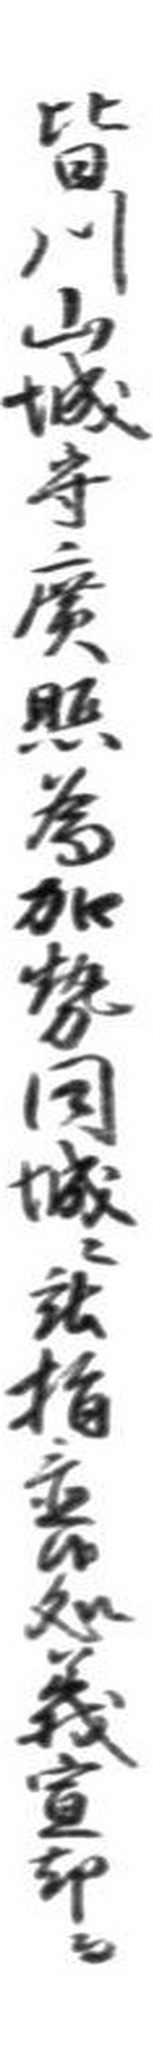皆川山城守広照為加勢同城ニ被指置候処義宣却而
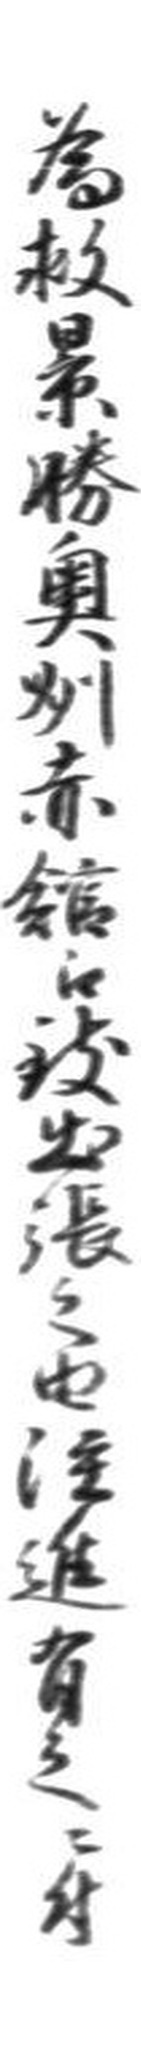為救景勝奥州赤館江致出張之由注進有之ニ付
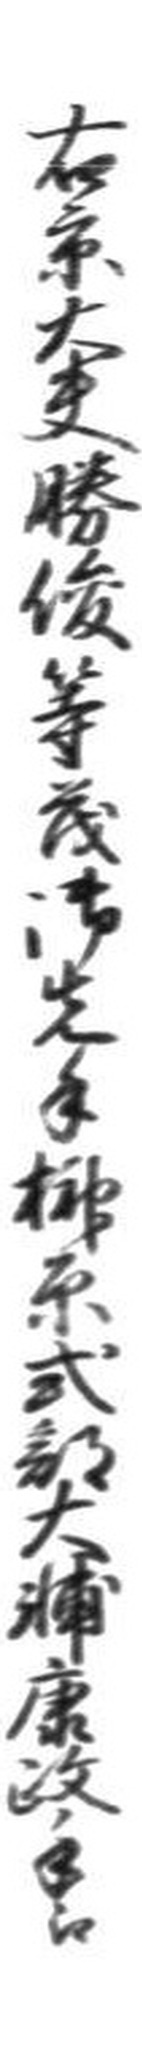右京大夫勝俊等も御先手榊原式部大輔康政手江
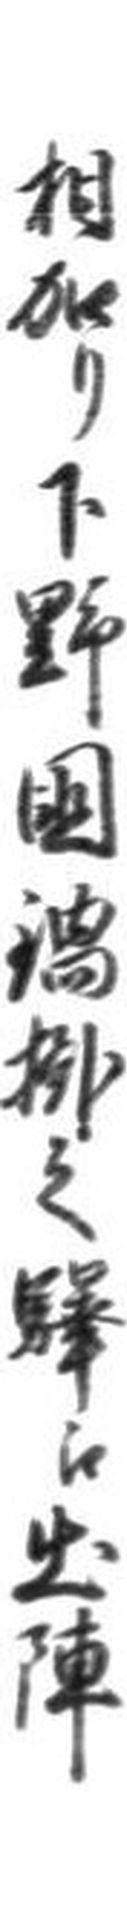相加リ下野国鍋掛之駅江出陣
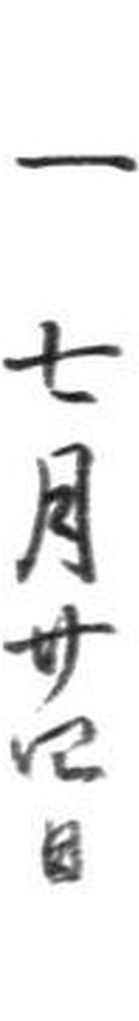一七月廿四日
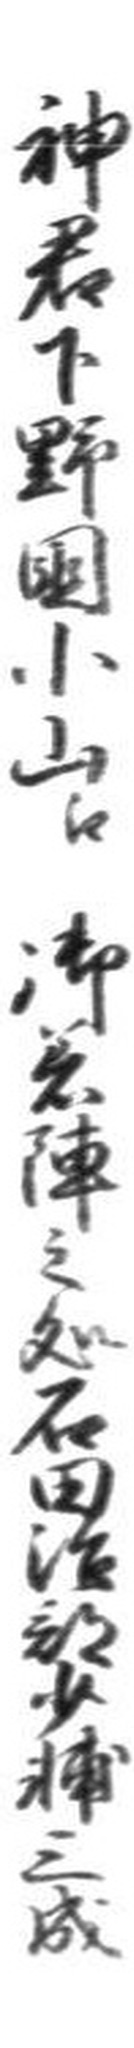神君下野国小山江御着陣之処石田治部少輔三成
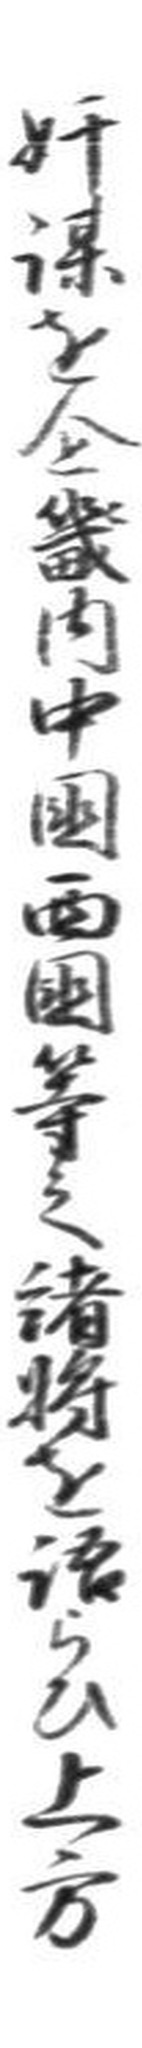奸謀を企畿内中国西国等之諸将を語らひ上方
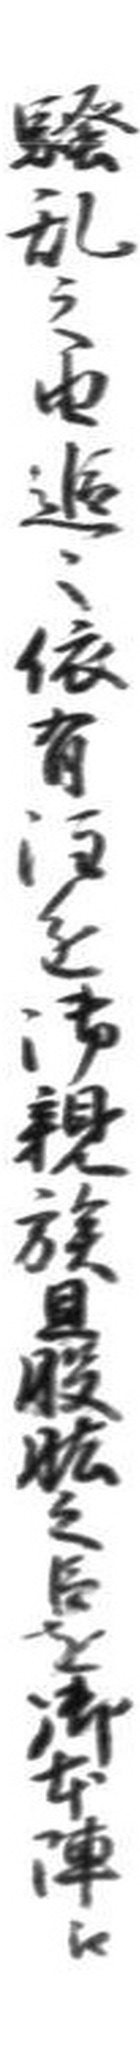騒乱之由追々依有注進御親族且股肱之臣を御本陣江

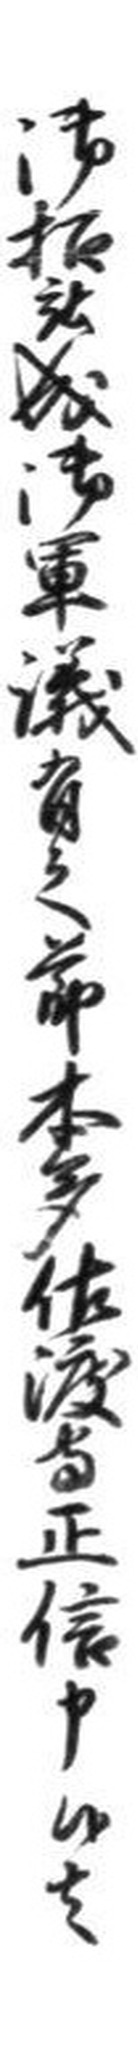御招被成御軍議有之節本多佐渡守正信申候者
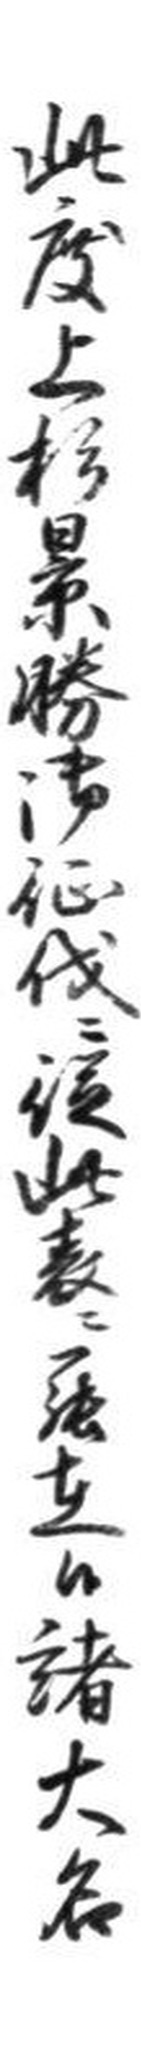此度上杉景勝御征伐ニ従此表ニ罷在候諸大名
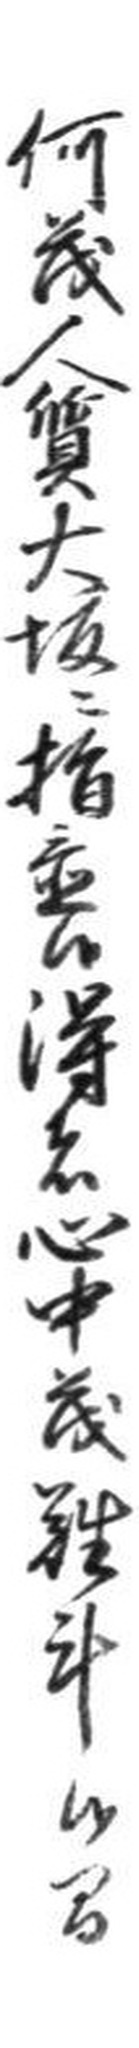何も人質大坂ニ指置候得者心中も難斗候間
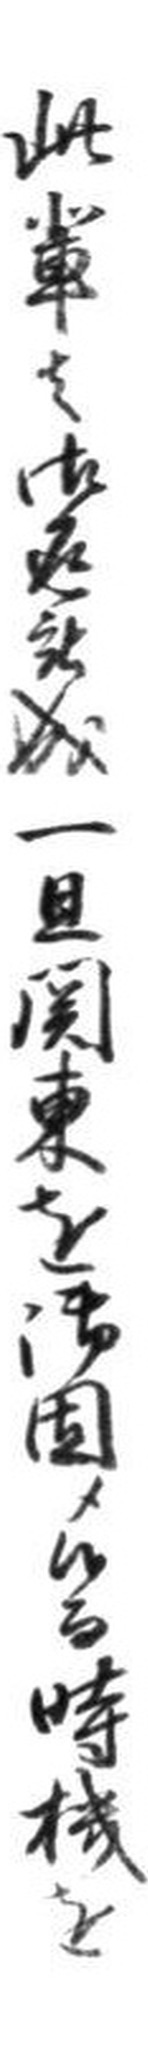此輩者御返被成一旦関東を固メ候而時機を
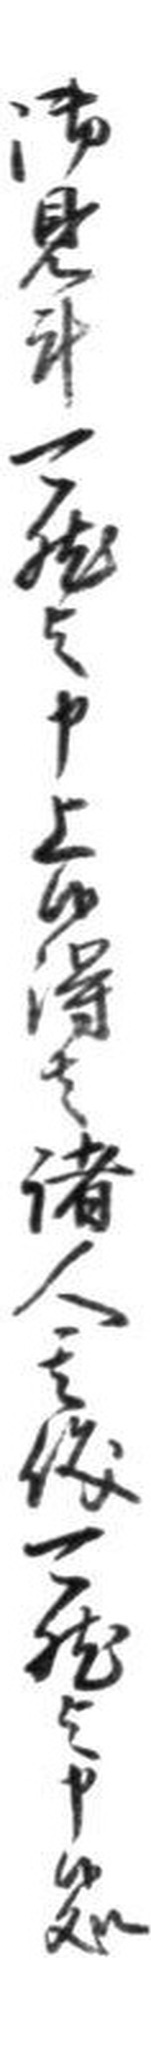御見斗可然と申上候得者諸人其儀可然と申候処
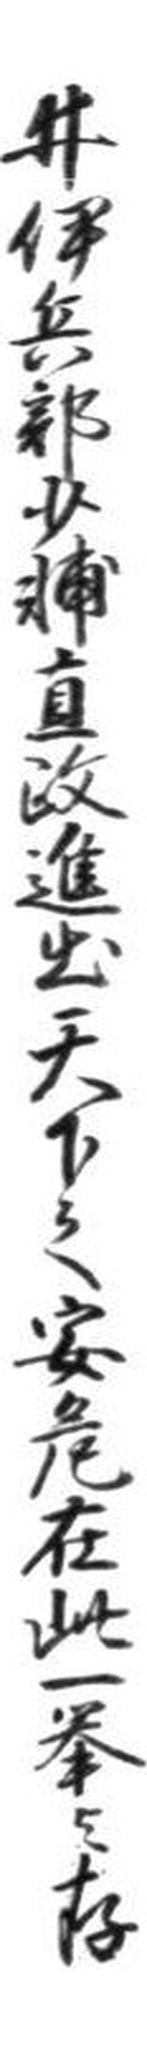井伊兵部少輔直政進出天下之安危在此一挙と存
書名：家譜 一 秀康公 従天正二年到慶長十二年
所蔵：福井県文書館 Fukui Prefectural Archives
